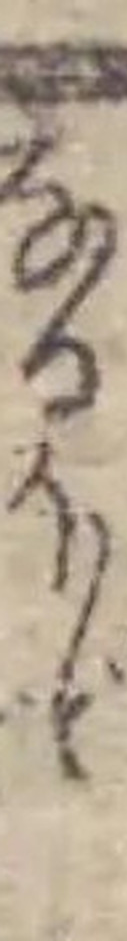なるほど
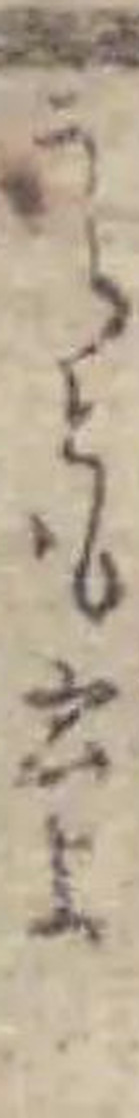うらとも云よ
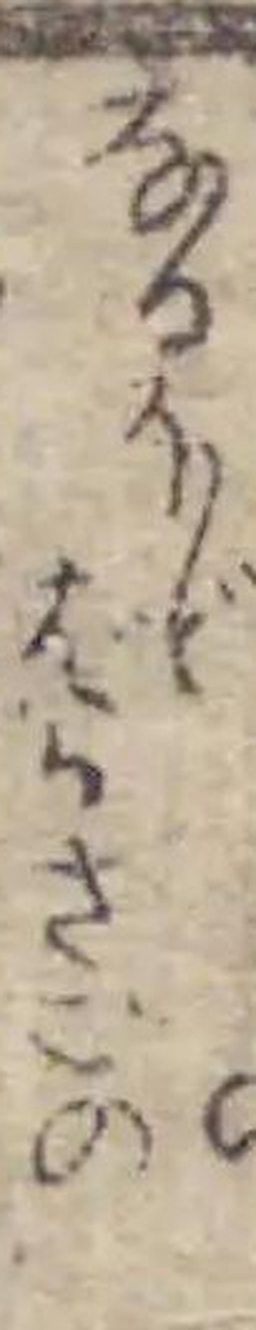ばかさごの
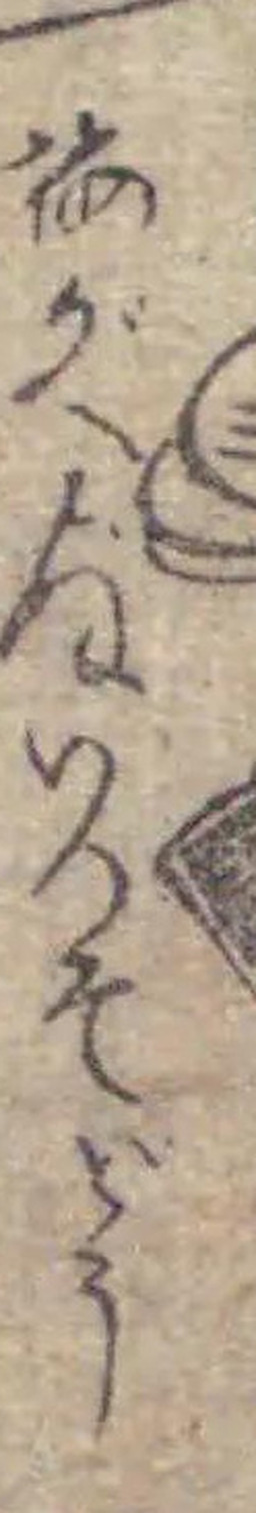梅がへさまいつそどう
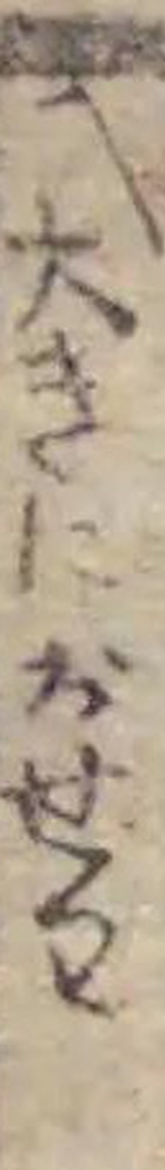〽大きにおせわ
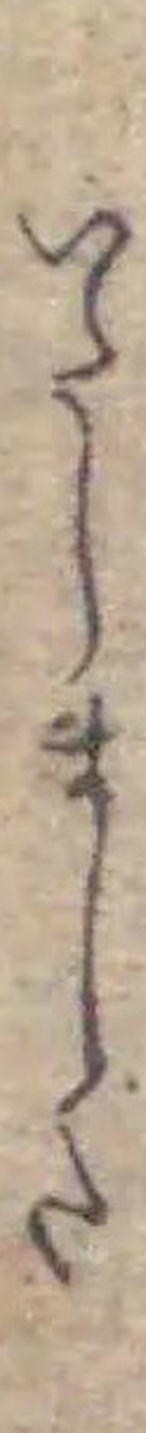いたしました

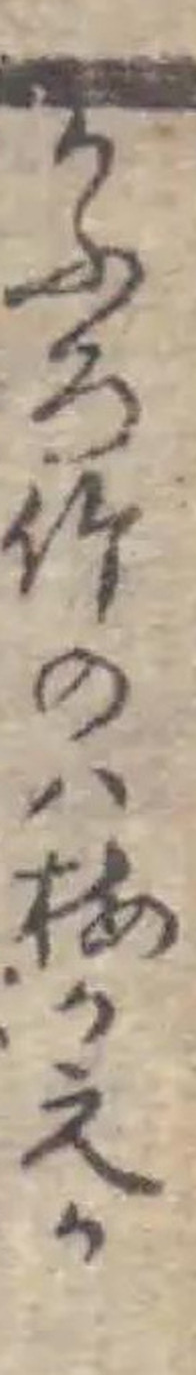かふろ竹のは梅かえか
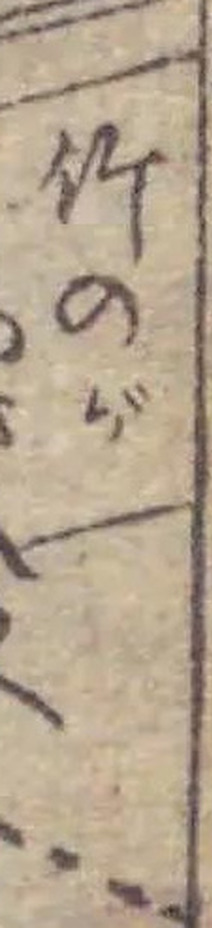竹のが
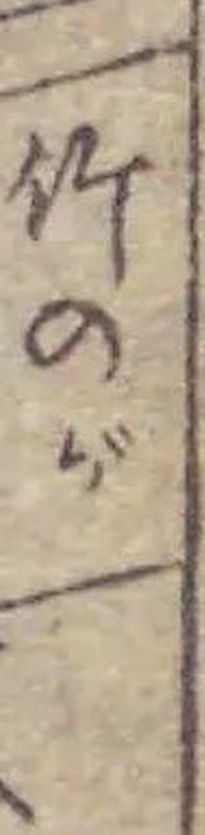竹のが
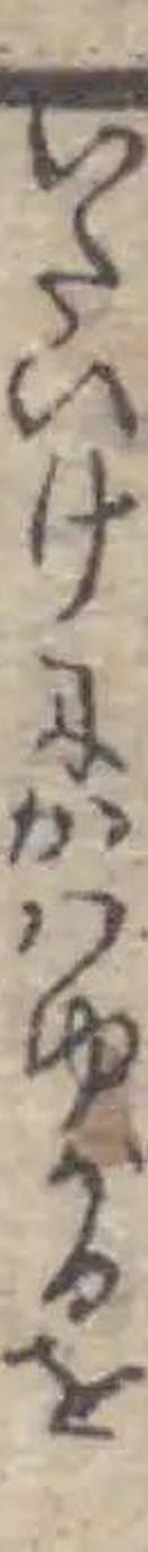いたいけにかはゆがるを
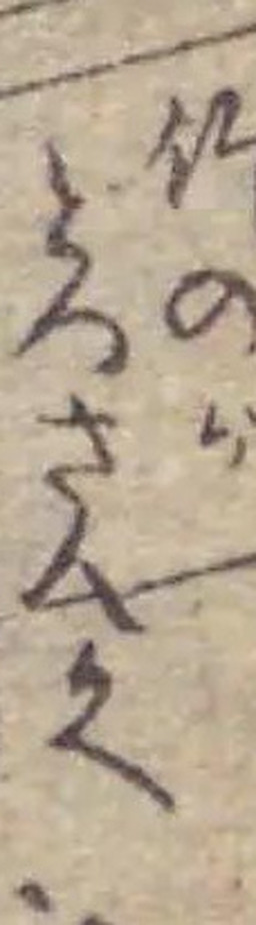とつさんかへ
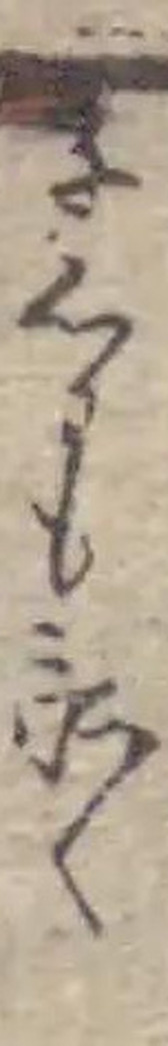子心にも忝く
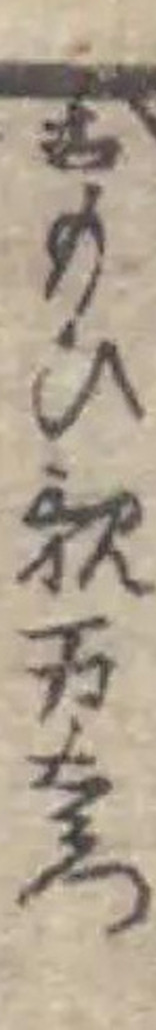おもひ親万右衛門
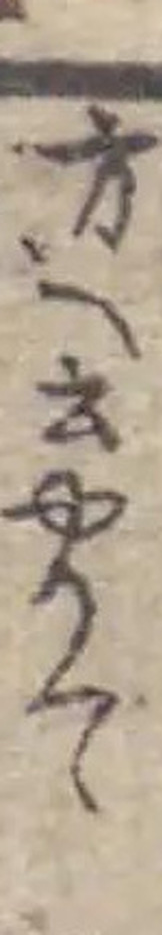方へ云やりて
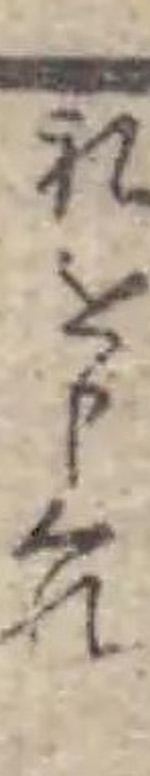礼を申くれ
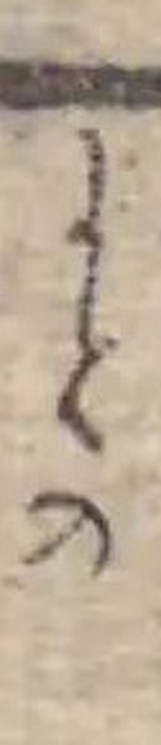よとの
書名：見立蓬莱 : 2巻
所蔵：国立国会図書館 National Diet Library, JAPAN
